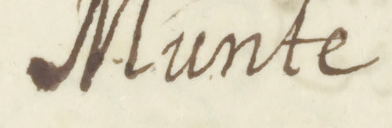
Munte
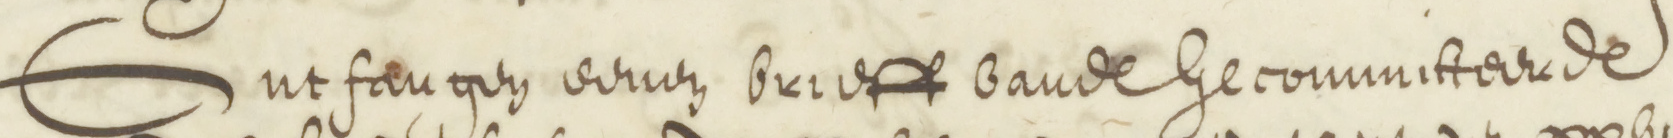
Ontfangen eenen brieff vande Gecommitteerde
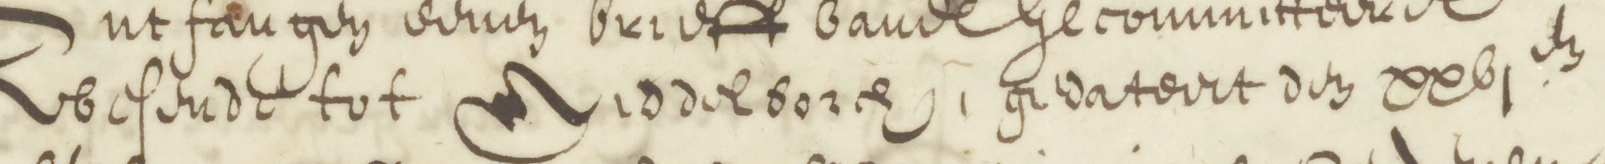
wesende tot Middelborch, gedateert den xxxvien
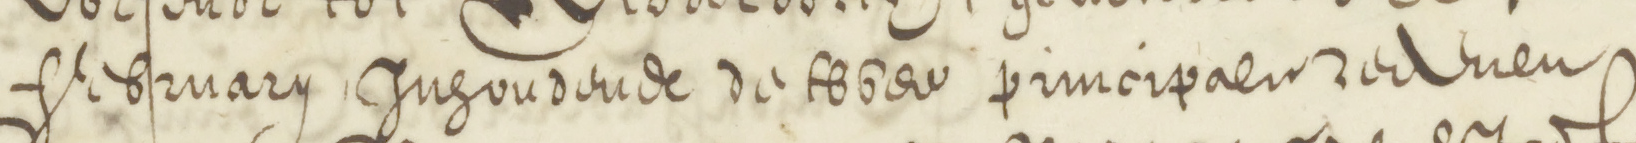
february, Inhoudende de twee principale redenen
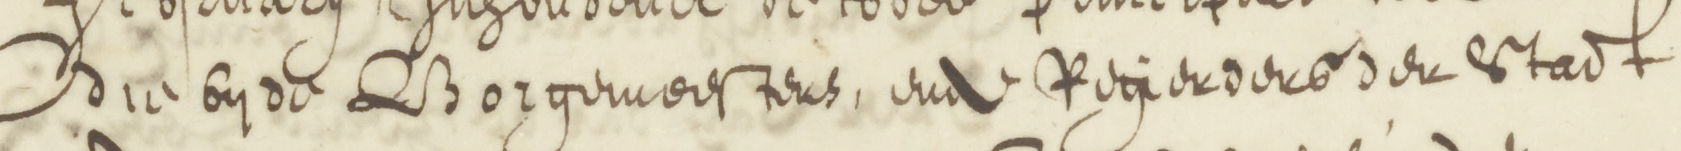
die byde Borgemeesters, ende Regierders der Stadt
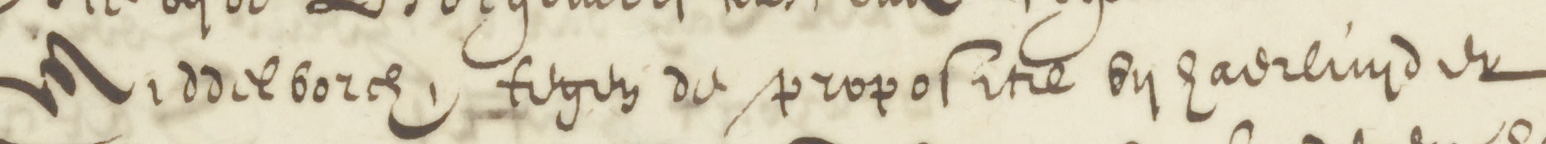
Middelborch, tegen de propositie by haerluyder
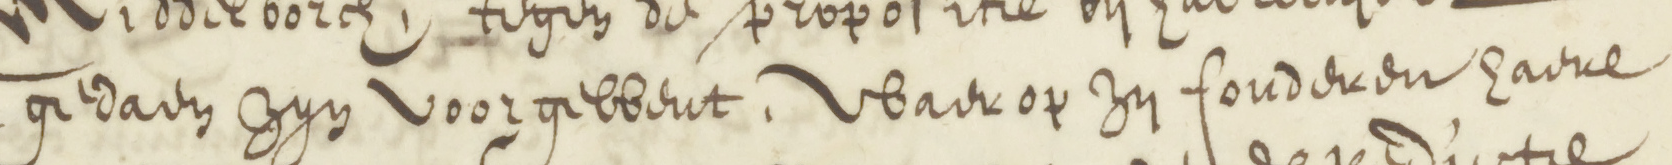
gedaen zyn voorgewent. Waerop zy sonderen haere
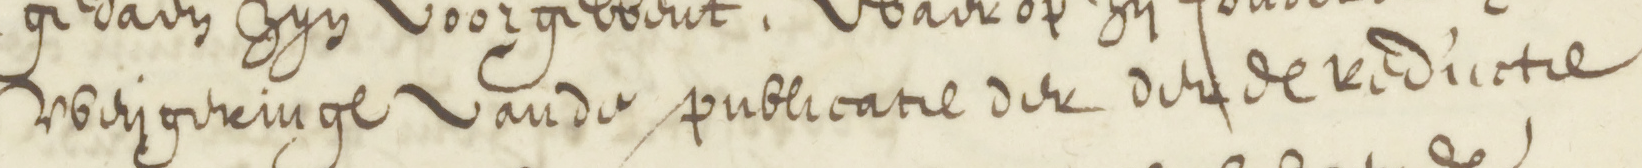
weygeringe vande publicatie der derde reductie
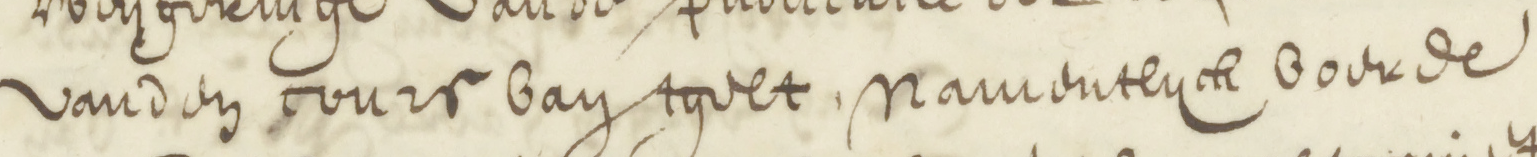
vanden cours van tgelt, namentlyck voer de
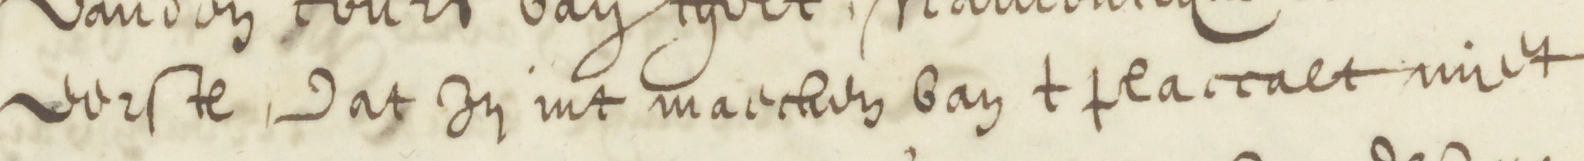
eerste, dat zy int maecken van t placcaet niet
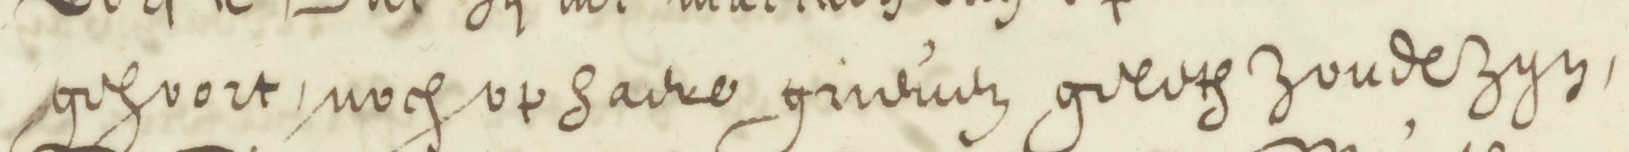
gehoort, noch op haere grieuen geleth zoude zyn,
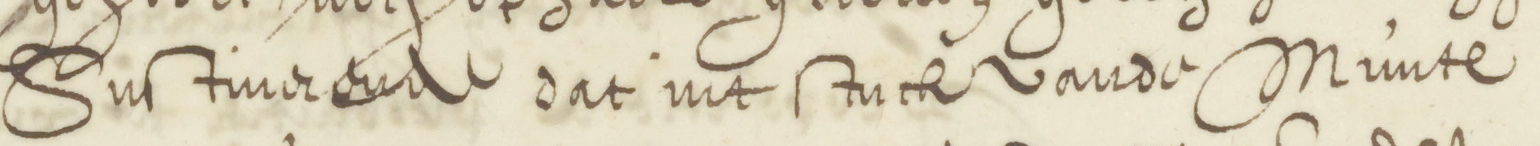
Sustinerende dat int stuck vande Munte
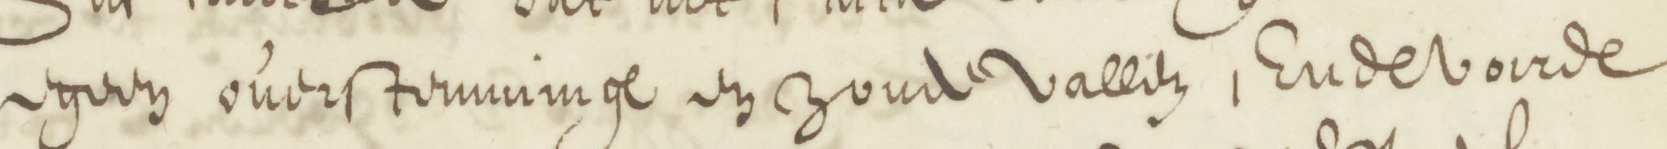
egeen ouerstemminge en zoude vallen. Ende voirde
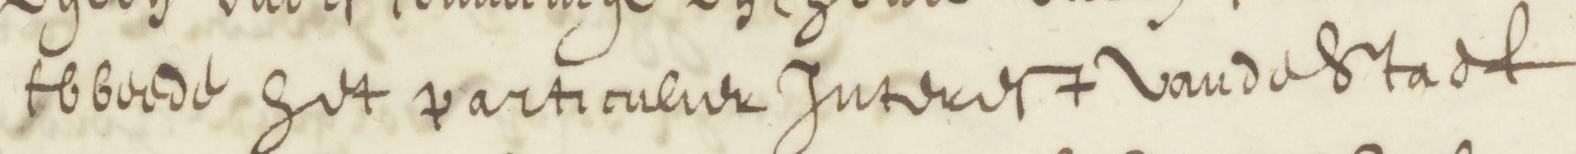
tweede het particulier Interest van de Stadt
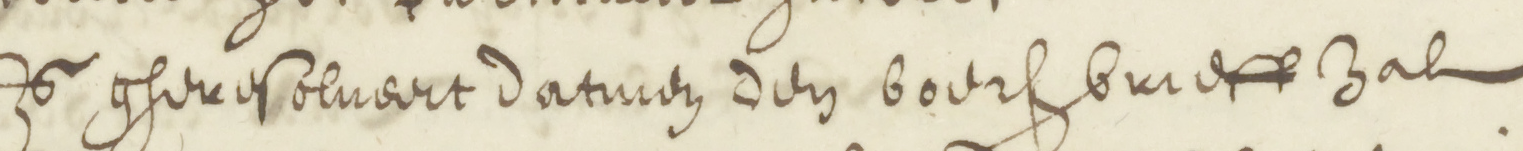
Is gheresolveert dat men den voers brieff zal
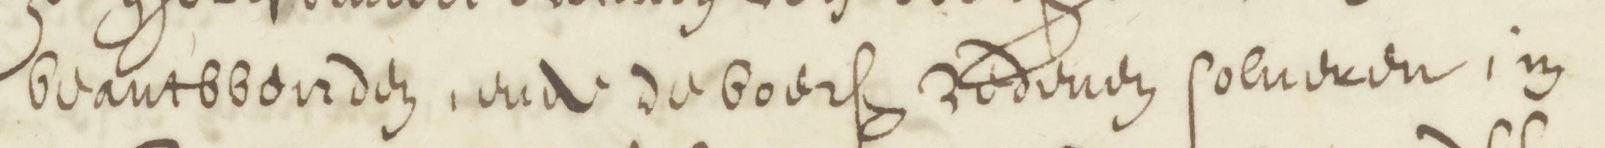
beantwoirden, ende de voers redenen solveren, in
